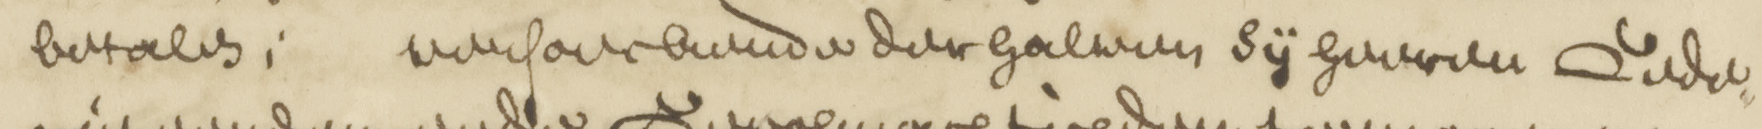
betalen; versoeckende derhalven bij heeren Gede„
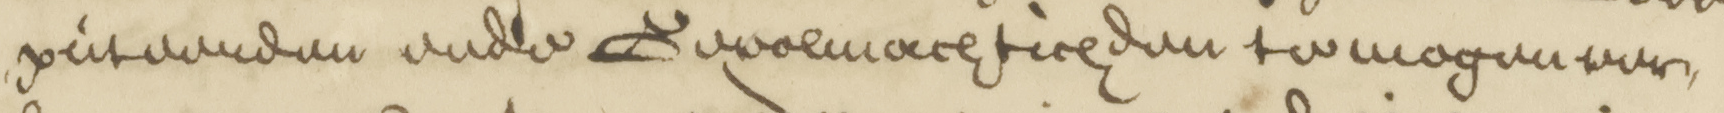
,,puteerden ende Gevolmachtichden te mogen ver„
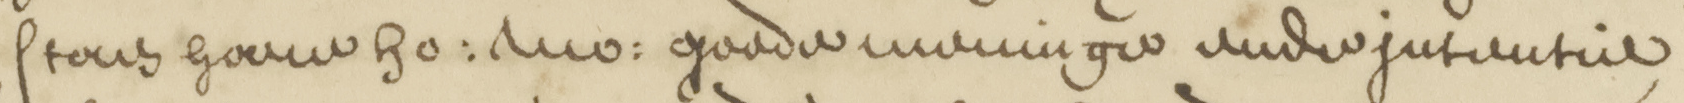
staen hare Ho:Mo: goede meninge ende intentie
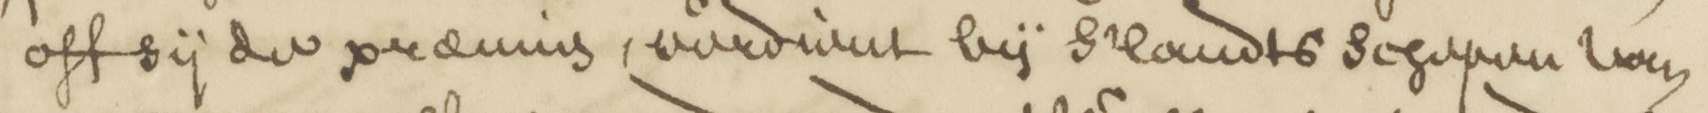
off sij de premien, verdient bij s'landts schepen van
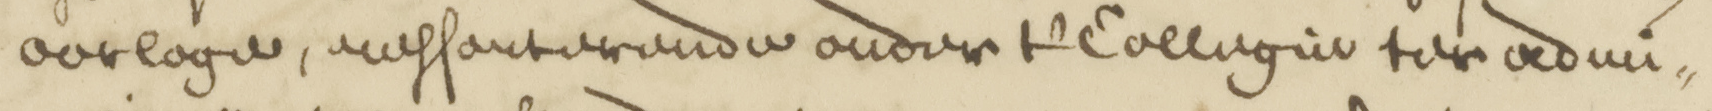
oorloge, ressorterende onder t' Collegie ter admi„
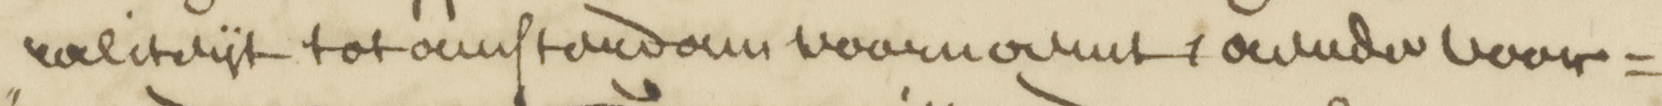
,,raliteijt tot Amsterdam voornoemt aende voor„
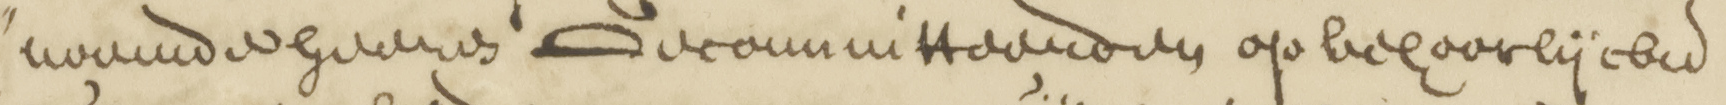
noemde heeren Gecommitteerden op behoorlijcke
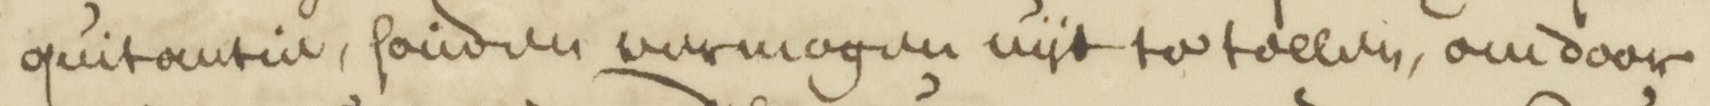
quitantie, souden vermogen uijt te tellen, om door
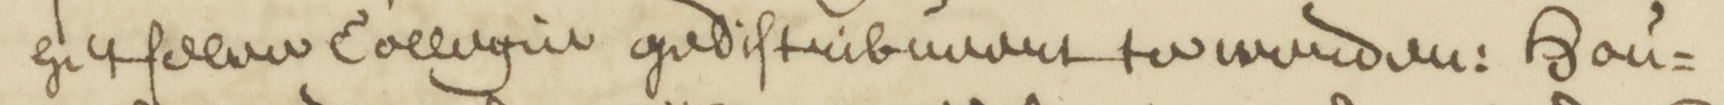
hetselve Collegie gedistribueert te werden: Hou„
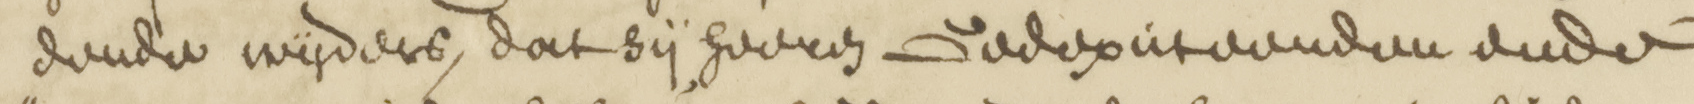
,,dende wijders, dat sij heeren Gedeputeerden ende
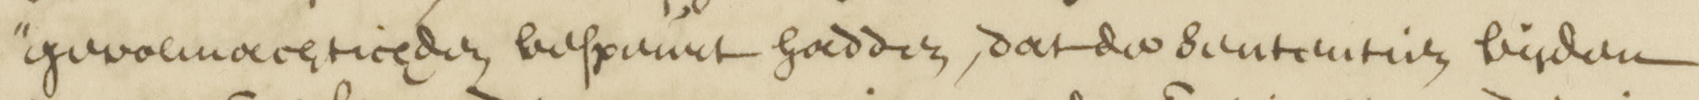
gevolmachtichden bespeurt hadden, dat de sententien bijden
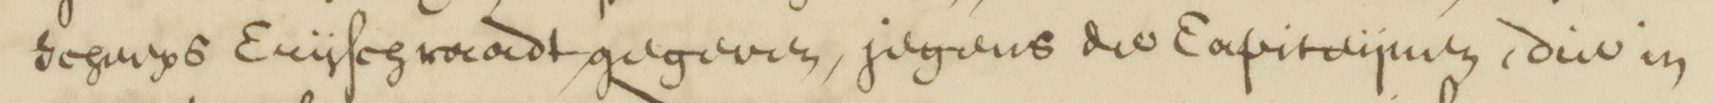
scheeps Crijschraadt gegeven, jegens de Capiteijnen, die in
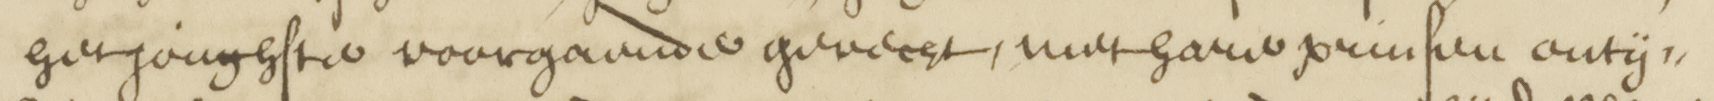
het jonghste voorgaende gevecht, met hare prinsen ontij„
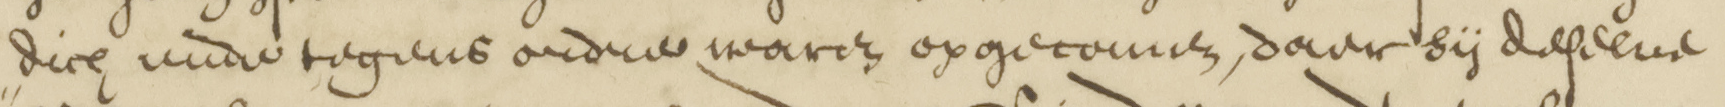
,,dich ende tegens ordre waren opgecomen, daer hij deselve
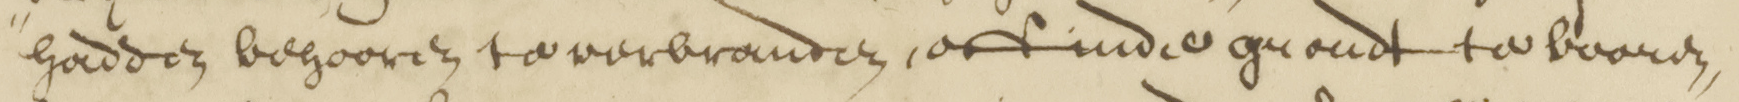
hadden behooren te verbranden, off inde grondt te booren,
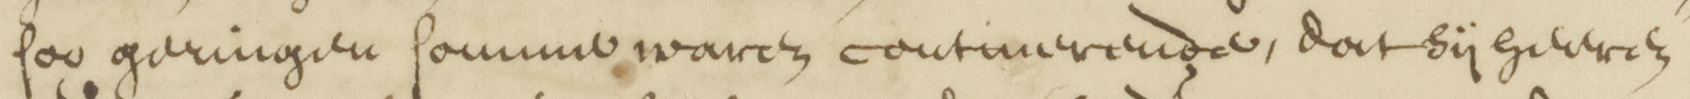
soo geringen somme waren continerende, dat hij heeren
